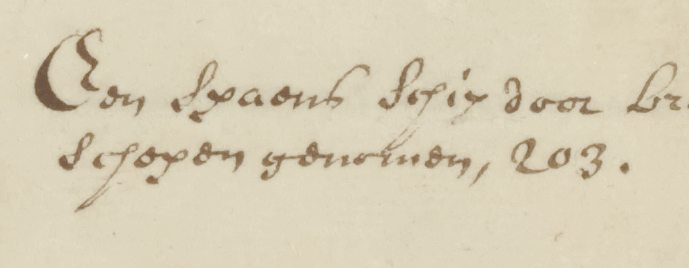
Schepen genomen, 203.
